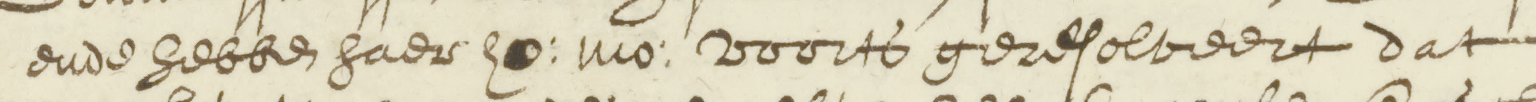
ende hebben haer ho:mo: voorts geresolveert dat
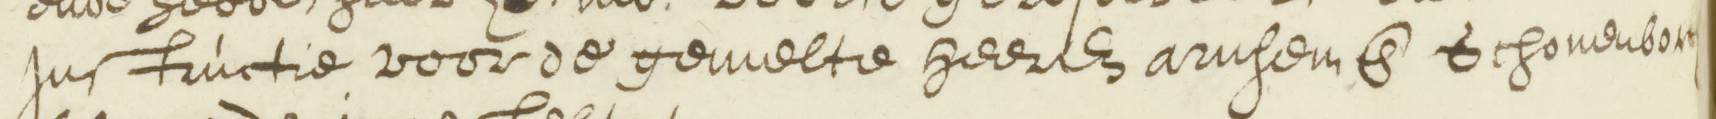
Instructie voor de gemelte heeren arnhem & Schonenborch
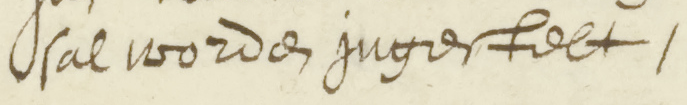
sal worden ingestelt.
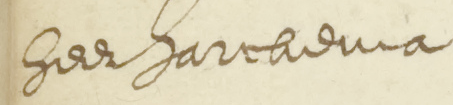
heer Harckema
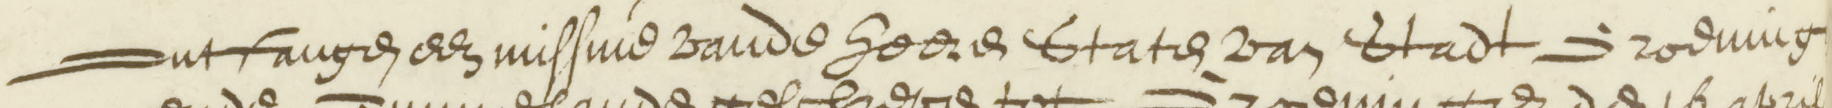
Ontfangen een missiue vande heeren Staten van Stadt Groening
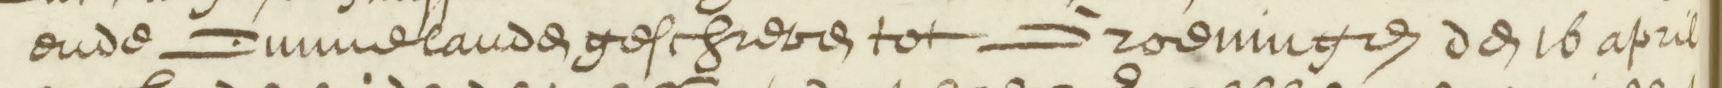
ende Ommelanden geschreven tot Groeningen den 16 april
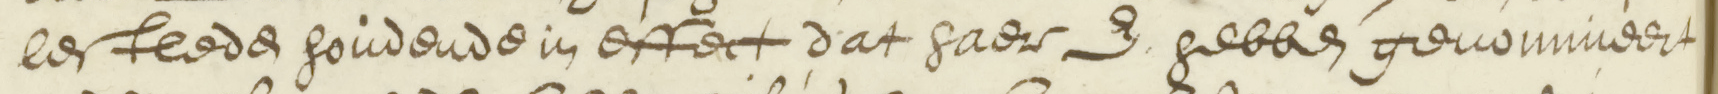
lestleden houdende in effect dat haer E. hebben genomineert
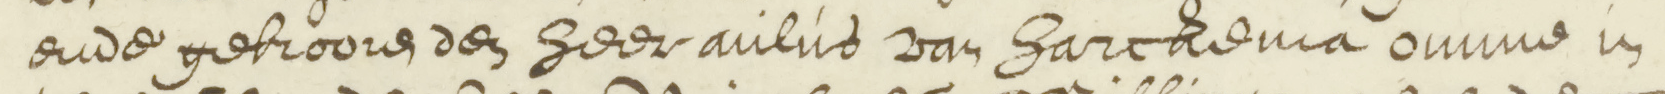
ende gekooren den heer aulus van Harckema omme in
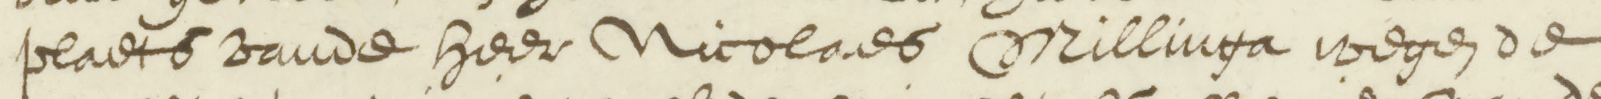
plaets vande heer Nicolaes Millinga wegen de
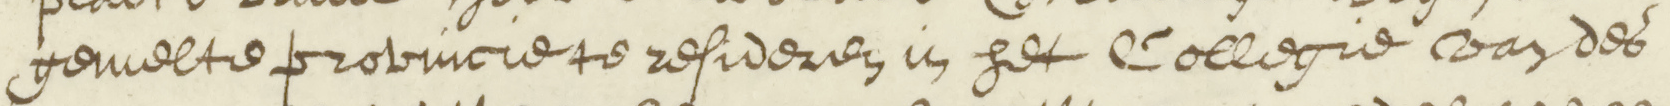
gemelte provincie te resideren in het Collegie van des
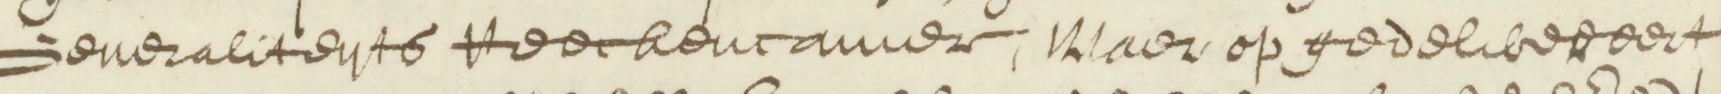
Generaliteyts Reeckencamer, Waer op gedelibereert
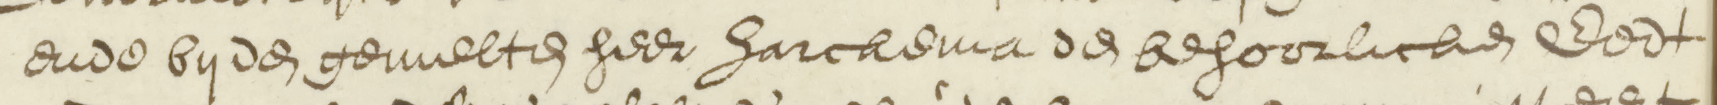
ende by den gemelten heer Harckema den behoorlicken Eedt
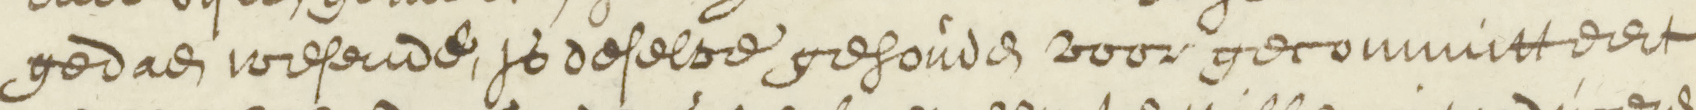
gedaen wesende, Is deselve gehouden voor gecommitteert
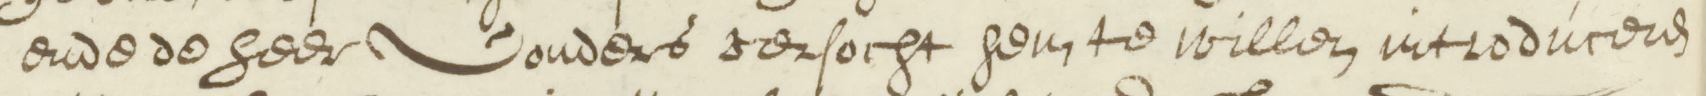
ende de heer Conders versocht hem te willen introduceren
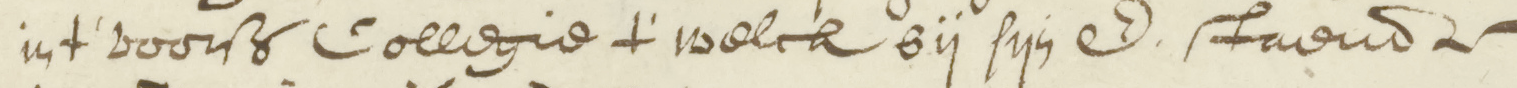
int' voors Collegie t'welck bij syn E. staende
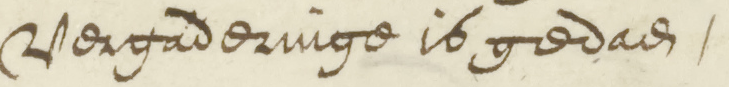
Vergaderinge is gedaen.
